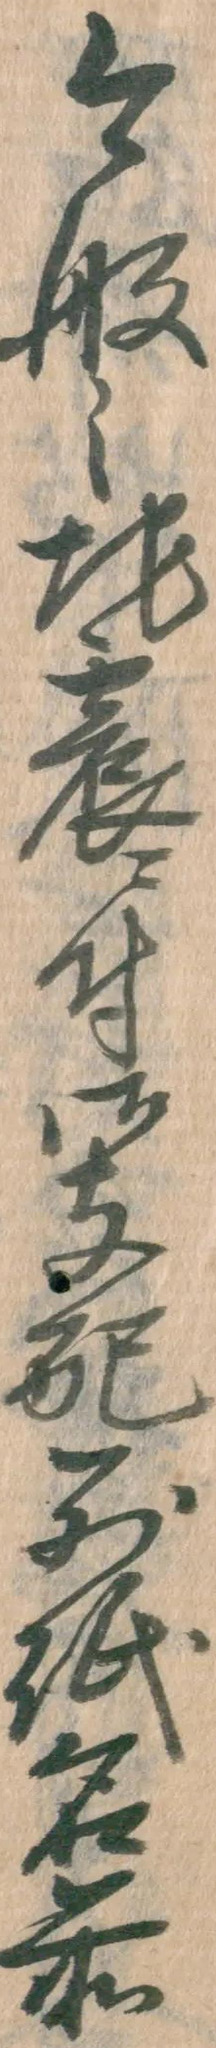今般之地震ニ付御支配別紙名前
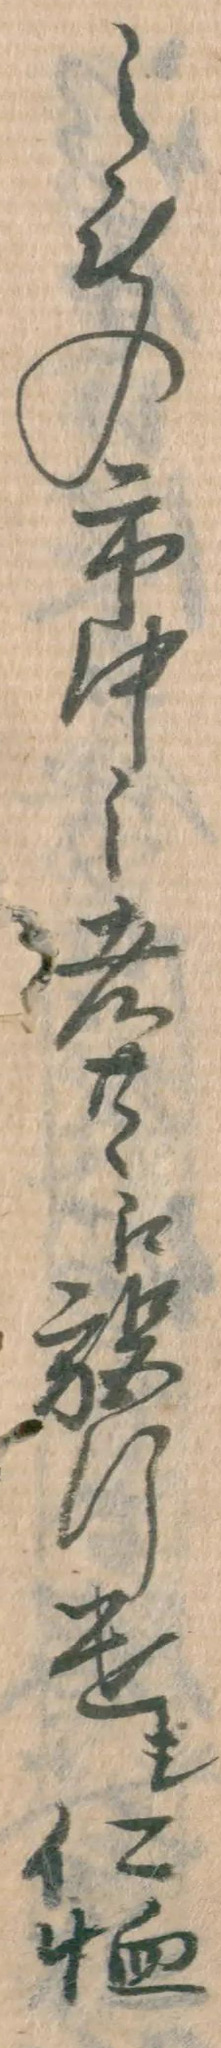之もの市中之者共え施行遣シ仁恤

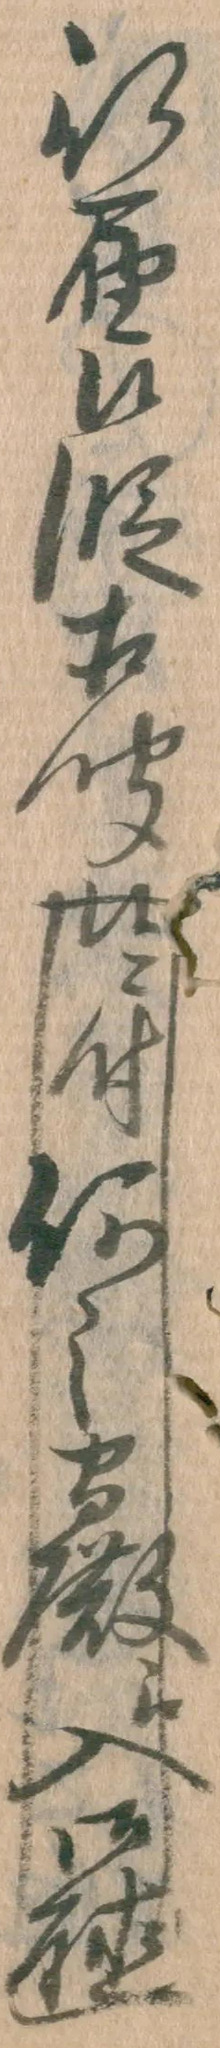行届候段相聞「候ニ付何之守殿え入御聴」
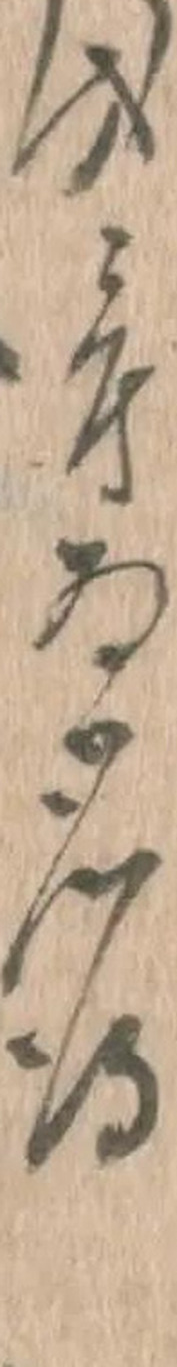儀ニ付為御心得
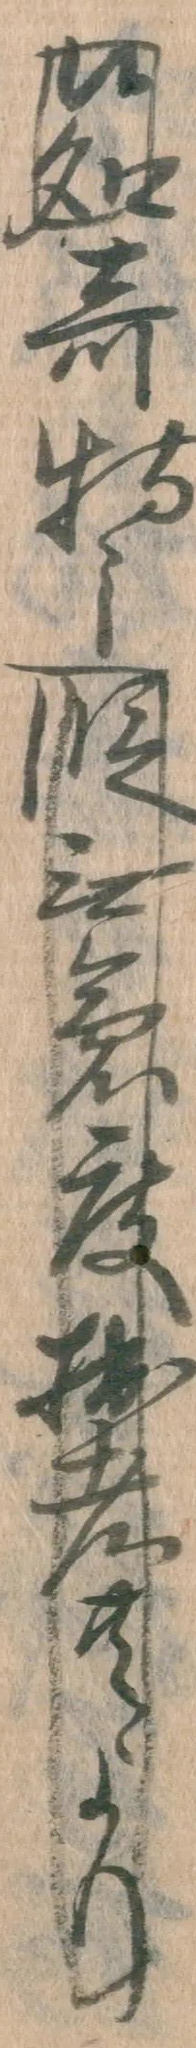候処奇特之「段無急度拙者共より
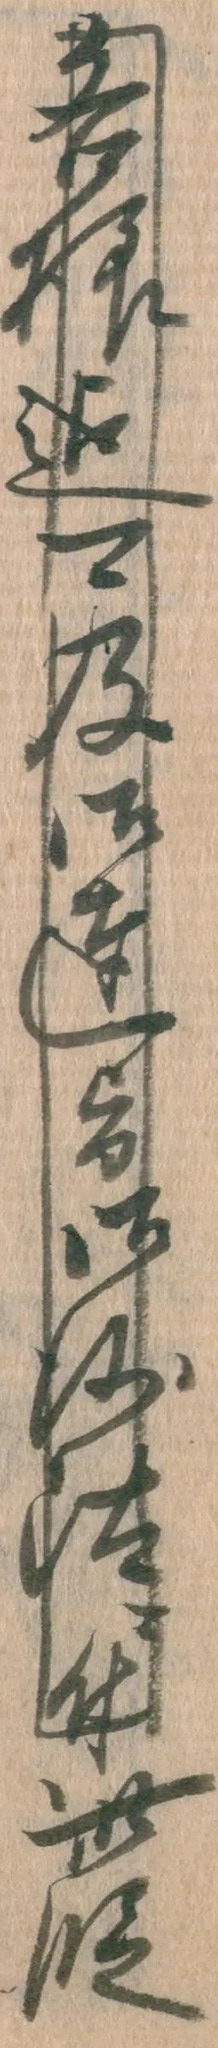各様迄可及御達旨御沙汰ニ付」此段
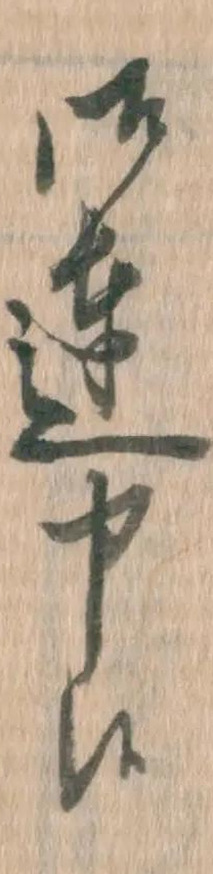御達申候
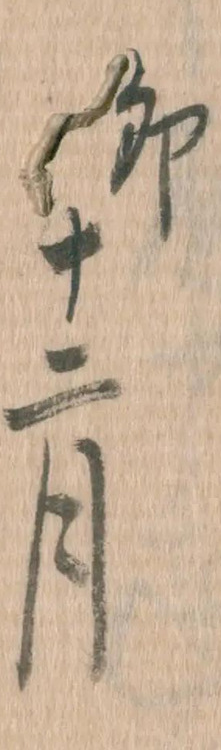卯十二月
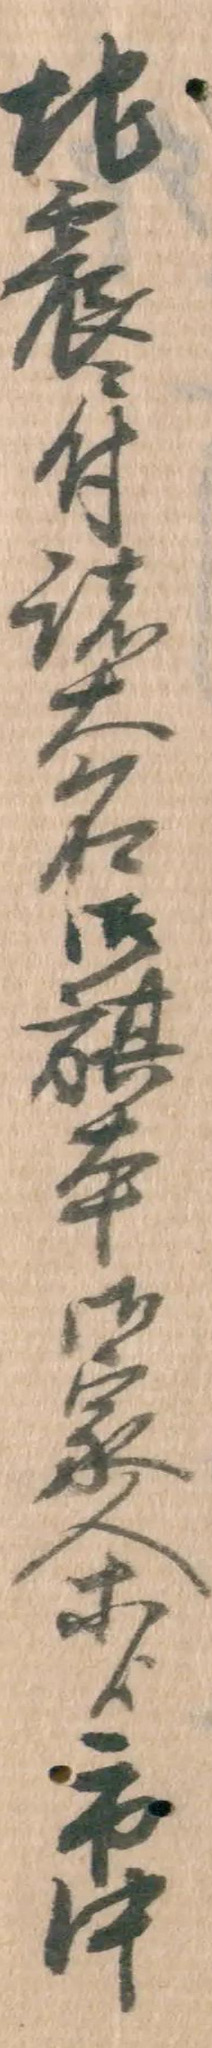地震ニ付諸大名御旗本御家人等ゟ市中
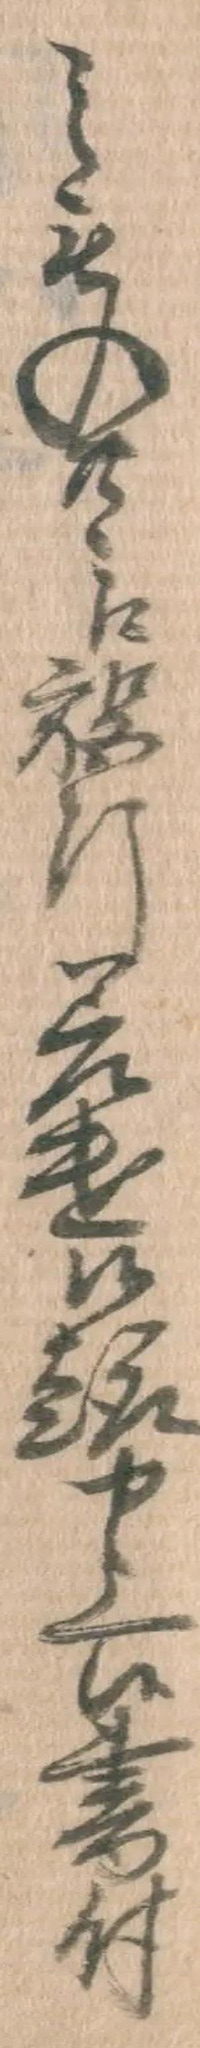之もの共え施行差遣候趣申上候書付
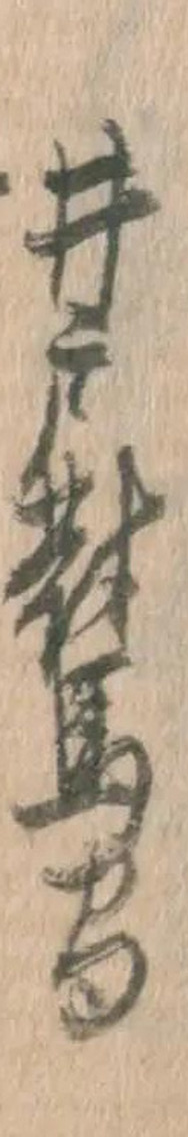井戸対馬守
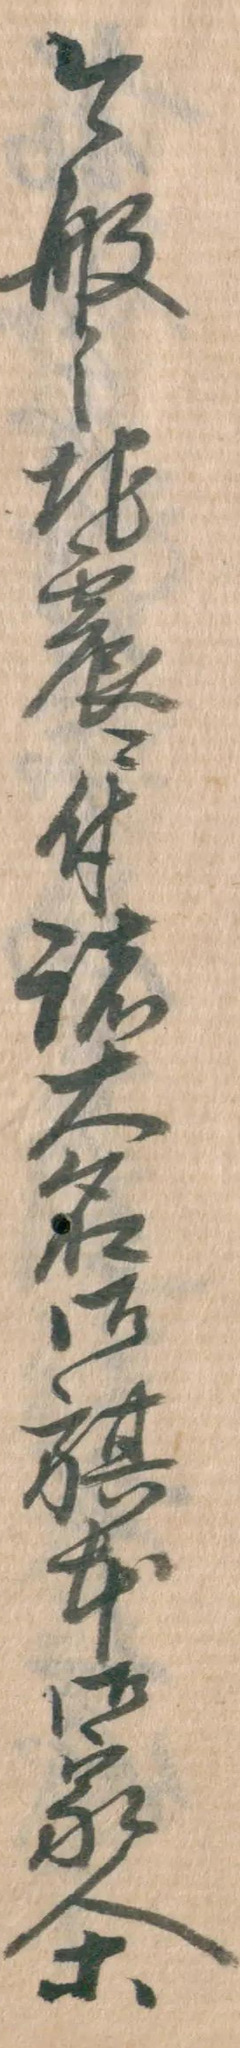今般之地震ニ付諸大名御旗本御家人等
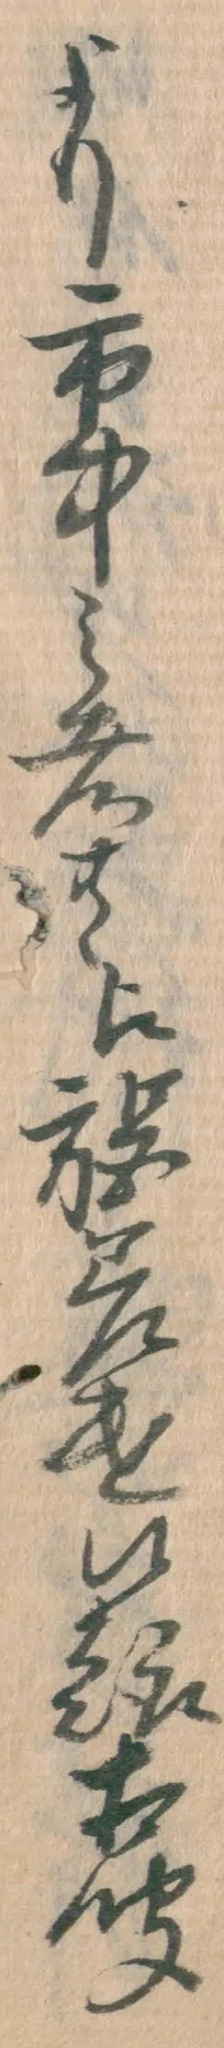より市中之者共え施差遣候趣相聞

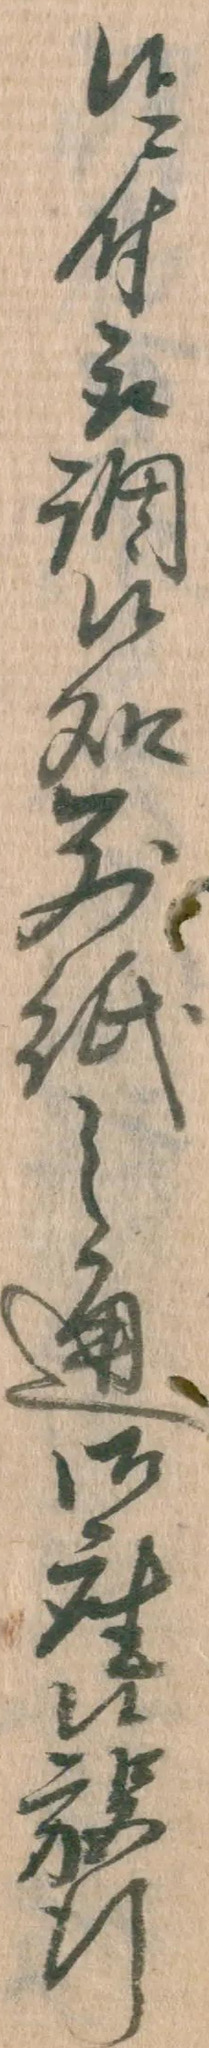候ニ付取調候処別紙之通御座候施行
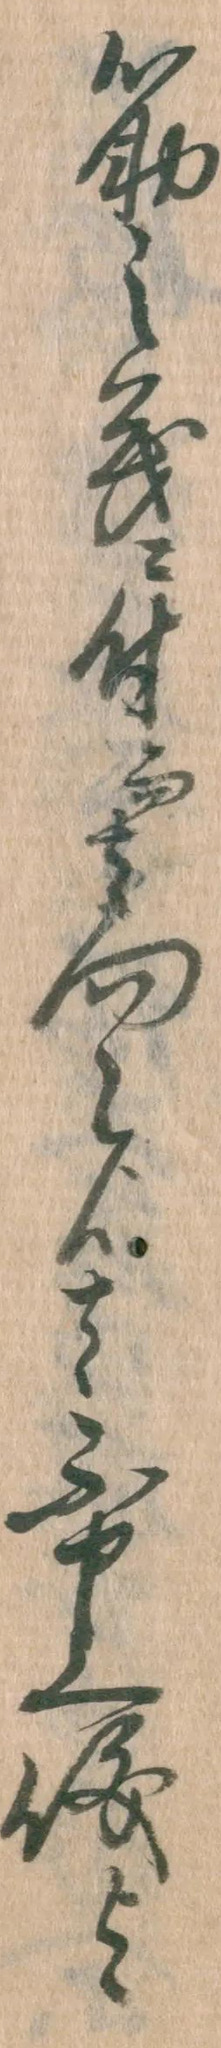筋之義ニ付而は向々ゟは不申上儀と
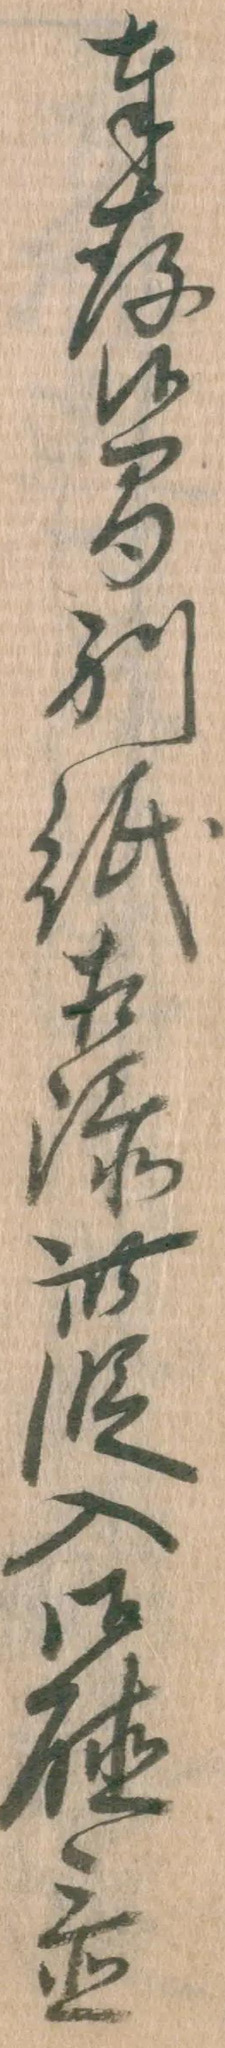奉存候間別紙相添此段入御聴置
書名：武家方并寺院等ニテ施差出候一件
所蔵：国立国会図書館 National Diet Library, JAPAN
